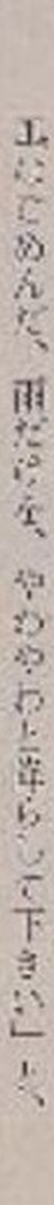風はごめんだ、雨だけを、やわやわと降らして下さい」と、
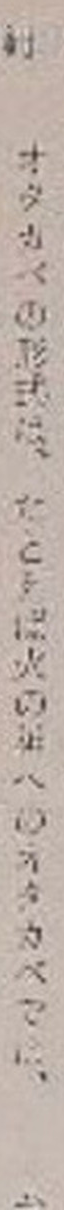オタカベの形式は、たとえば火の神へのオタカベでは、
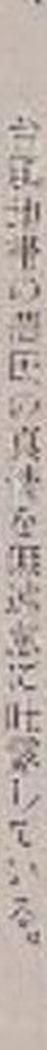台風地帯の農民の真情を無遠慮に吐露している。
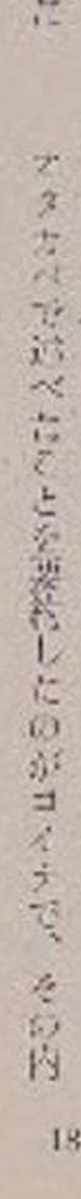オタカベで述べたことを要約したのがコイナで、その内

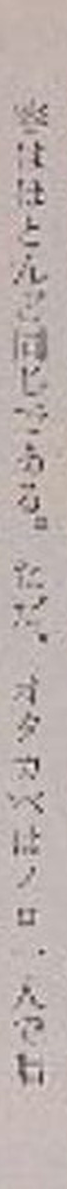容はほとんど同じである。ただ、オタカベはノロ一人で唱
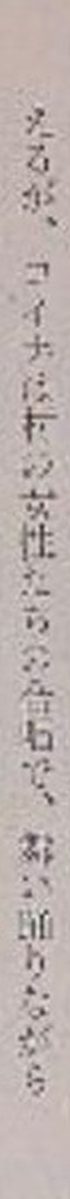えるが、コイナは村の女性たちの合唱で、舞い踊りながら
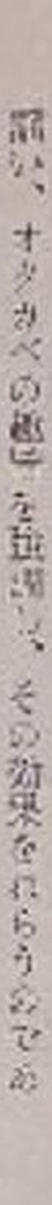謡い、オタカベの趣旨を強調し、その効果をねらうのであ
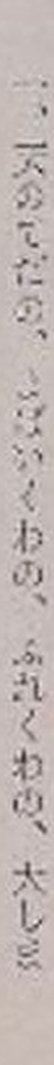一、天のてだの、よばいくわの、ふれくわの、大しま
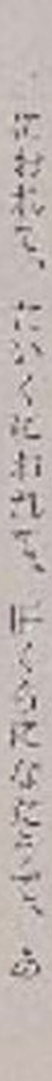におれて、たいくにおれて、くらになたうて、あ
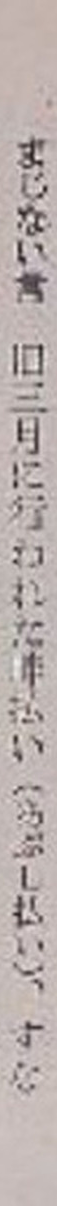まじない言旧三月に行われた畔払い(あぶし払い)、すな
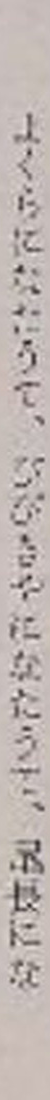よくらになたうて、ひびきやになたうて、尾長にな
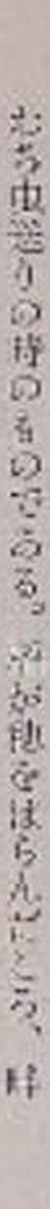わち虫送りの時のものである。稲が穂をはらんだころ、畔
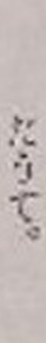たうて。
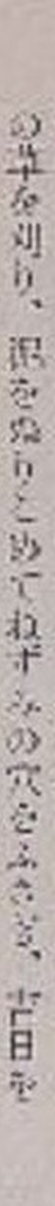の草を刈り、泥をぬりこめてねずみの穴をふさぎ、吉日を
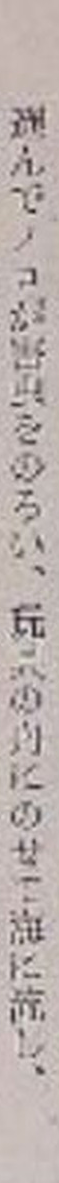選んでノロが害虫をのろい、の舟にのせて海に流し、
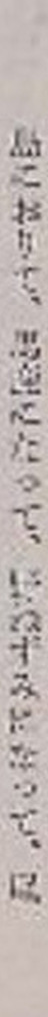島におりて、馬鹿になって、野ねずみになって、尾
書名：沖縄口承文芸
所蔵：University of the Ryukyus Library
